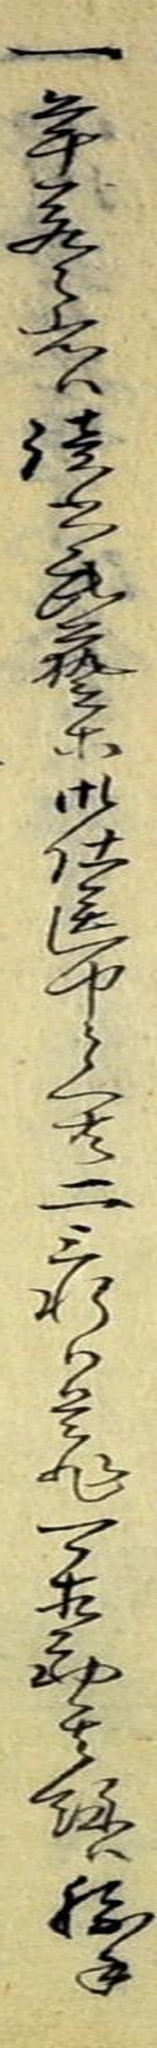一年若之者は読書武芸等御仕送り中に候へ共二三軒は是非可相勤其餘は勝手
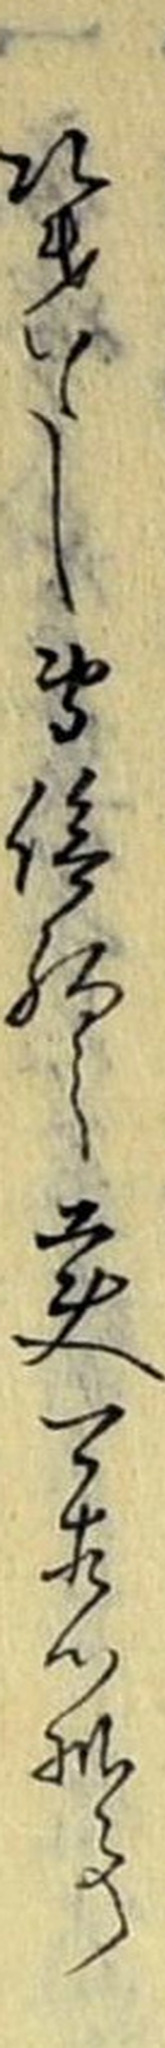次第いたし専倹約之工夫可相心掛事
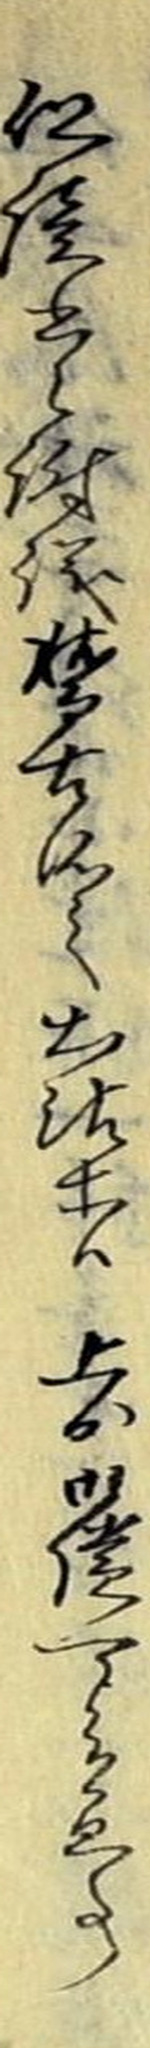但読書之謝議稽古所之出銀等は上ゟ御償可被下置候事
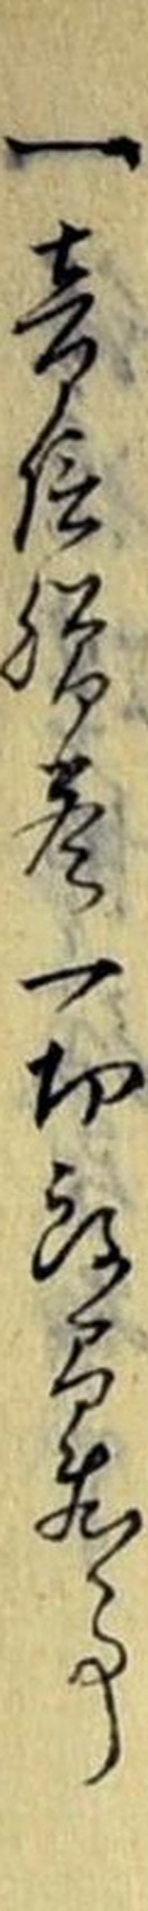一音信贈答一切致間敷事
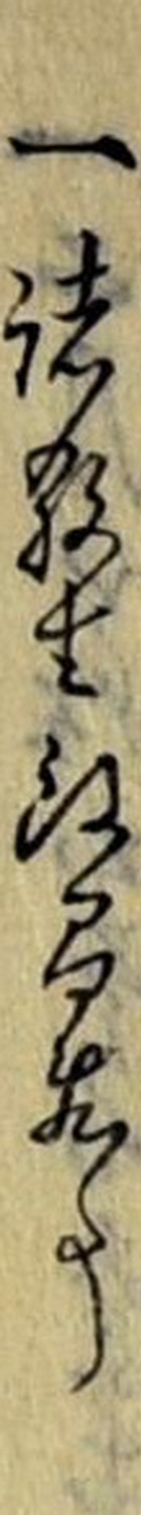一諸殺生致間敷事

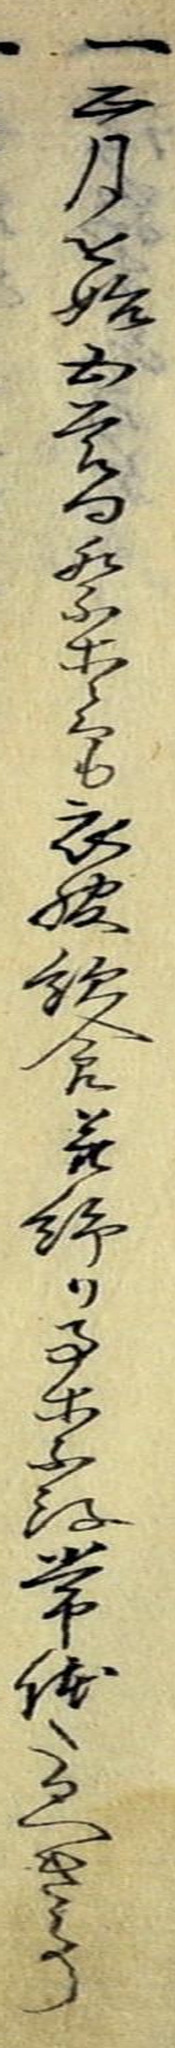一正月を始五節句祭等に而も衣服飲食井飾り事等不致常体たるへき之事
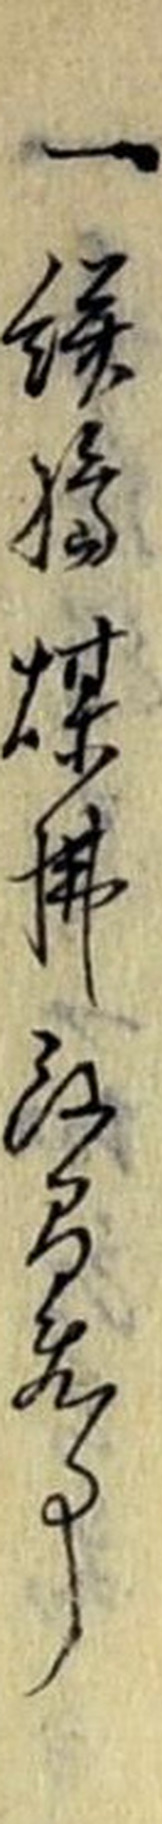一餅搗煤払致間敷事
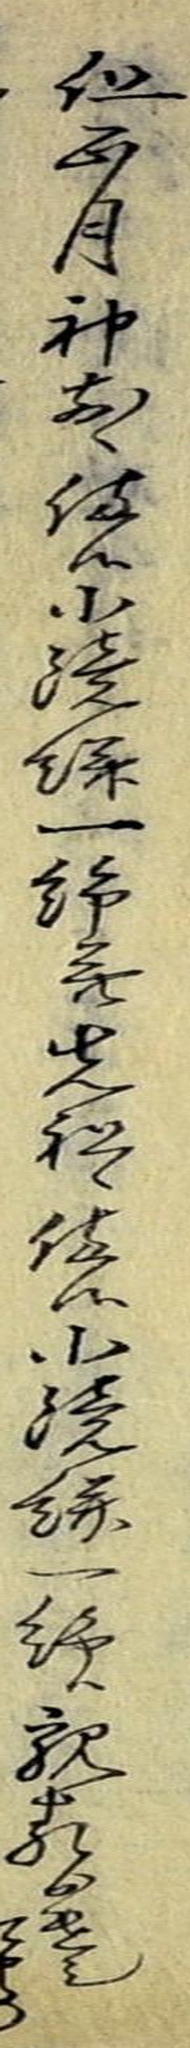但正月神前へ供候小鏡餅一飾井先祖へ供候小鏡餅一飾は親類ゟ遣し可申事
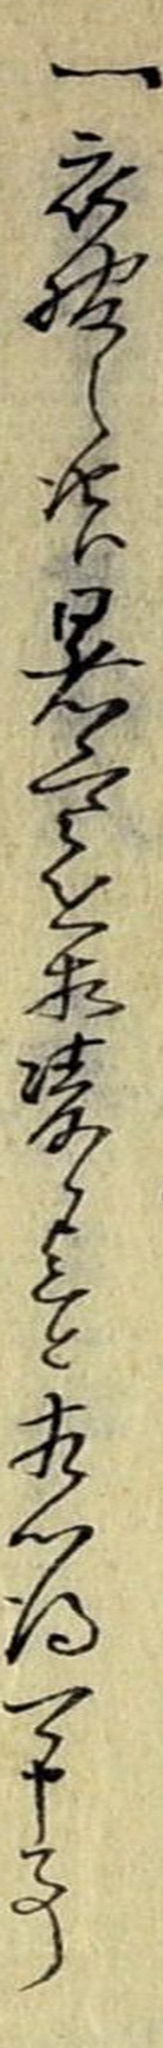一衣服之儀は暑寒を相凌候迄と相心得可申事
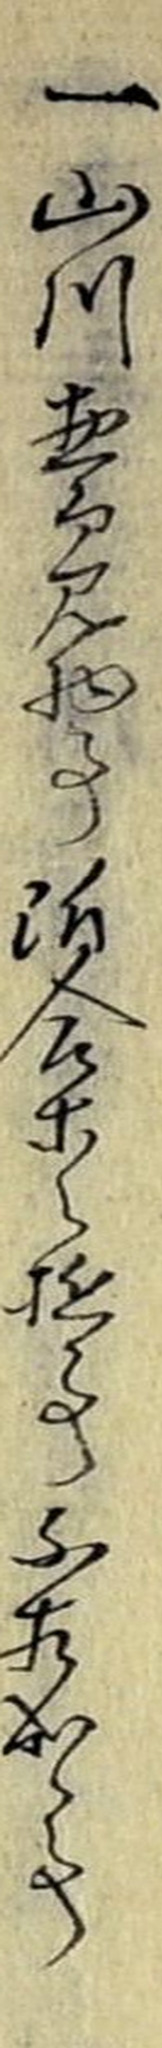一山川惣而見物事附合等之遊事不相成候事
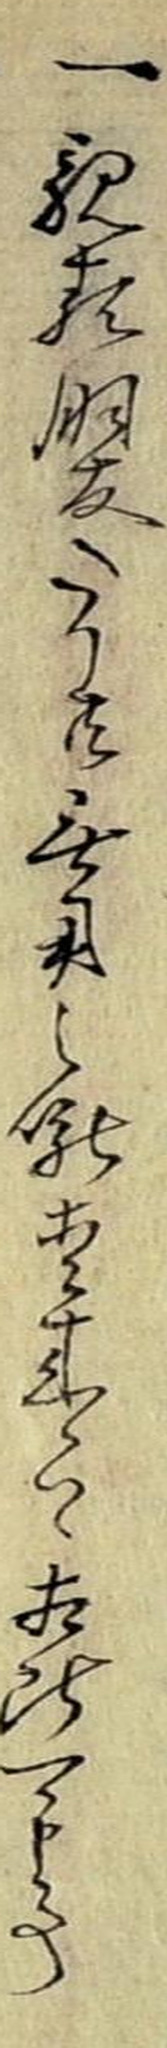一親類朋友たり共無用噺等に来候はヽ相断可申事
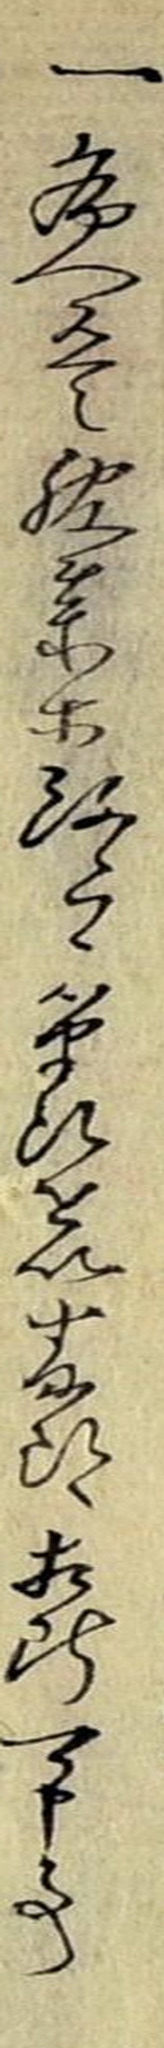一病人有之服薬等致候はヽ筆頭を以番頭へ相断可申事
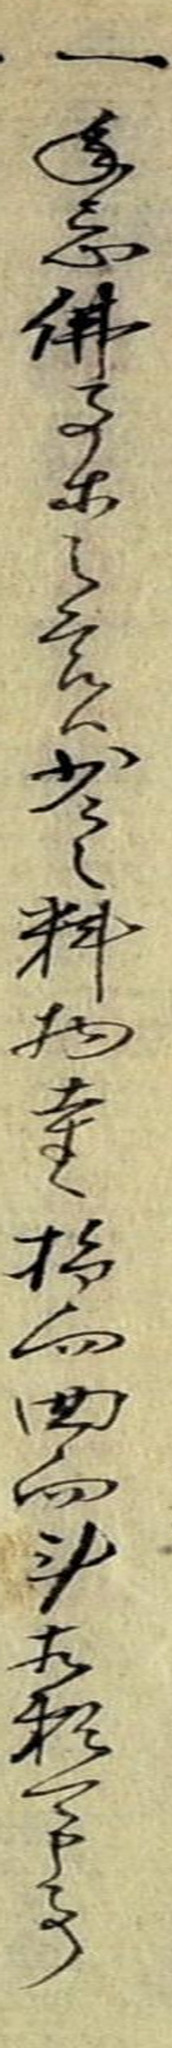一年忌仏事等之節は少々之料物寺等へ指向回向斗相頼可申事
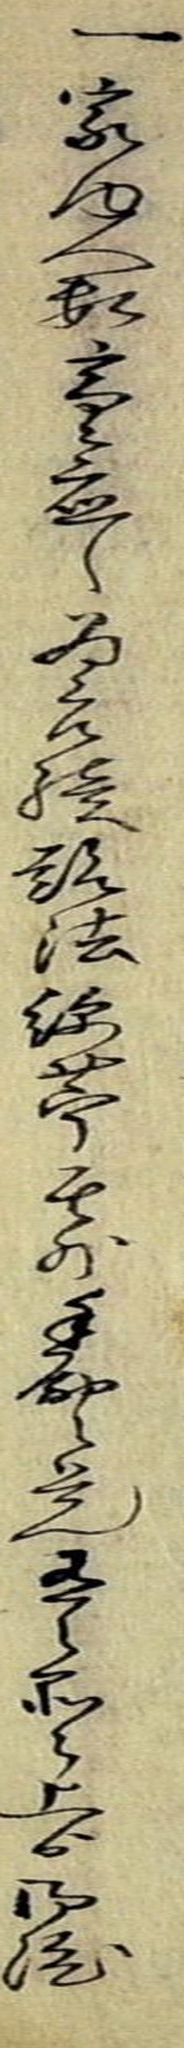一家内人数高に応し為取続趣法綿苧其外手励？之覚有之品々上ゟ御渡
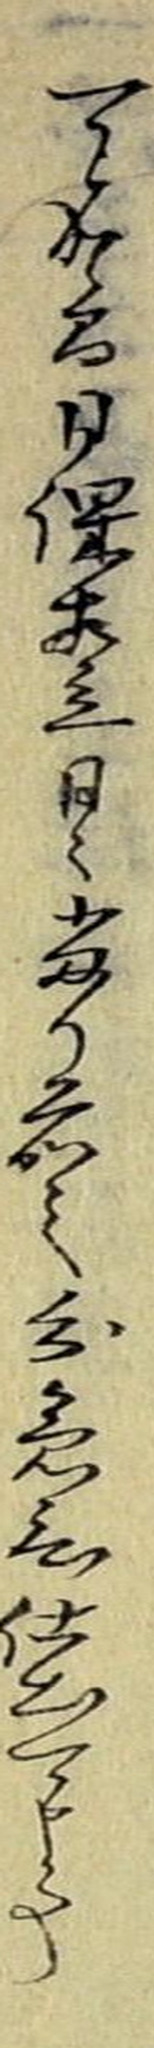可被成候間日課相立日々当り前之分急度仕出可申事
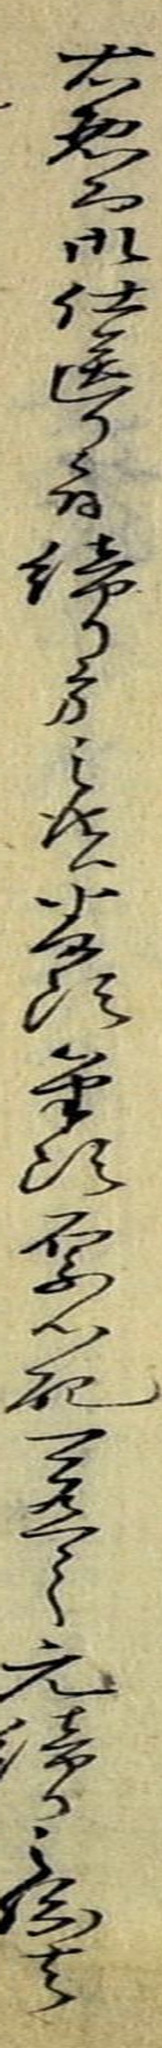右惣而御仕送りに付締り方之儀は番頭筆頭厚心配可有之元締り之議は
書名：命令之部 六
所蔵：福井県文書館 Fukui Prefectural Archives
